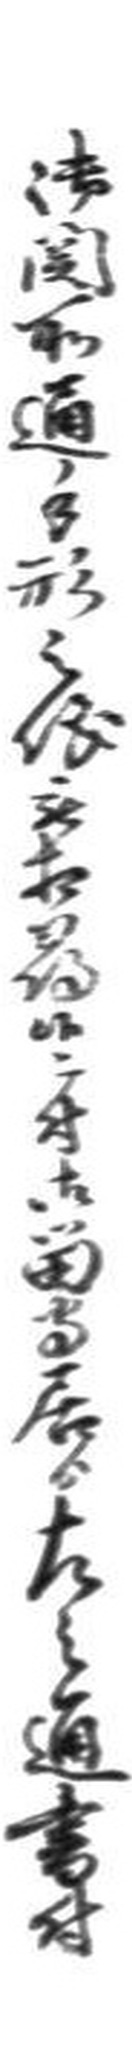御関所通手形之儀被相尋候ニ付御留守居ゟ左之通書付
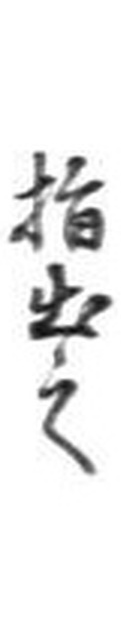指出之
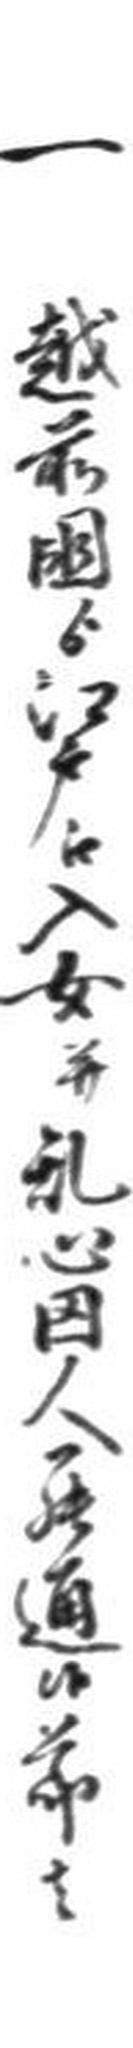一越前国ゟ江戸江入女へ并乱心囚人罷通候節者

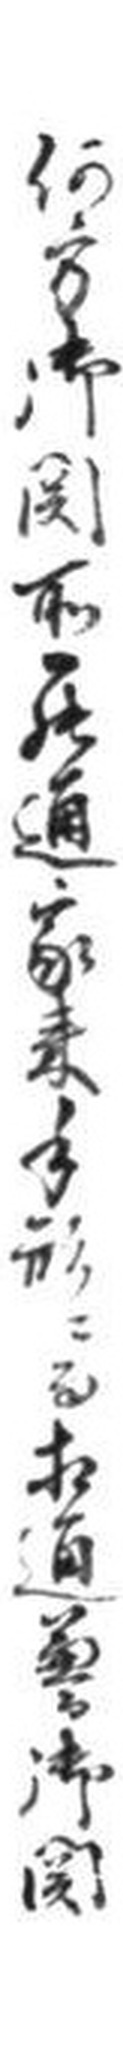何方御関所罷通家来手形ニ而相通兼而御関
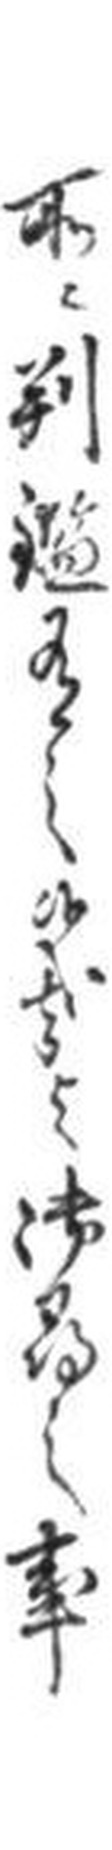所ニ判鑑有之候哉与御尋之事
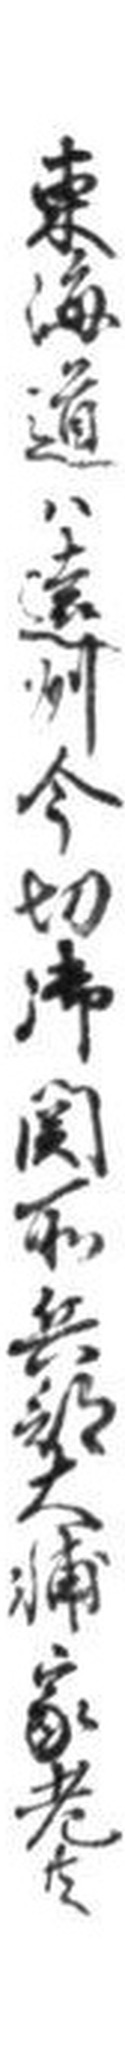東海道ハ遠州今切御関所兵部大輔家老共
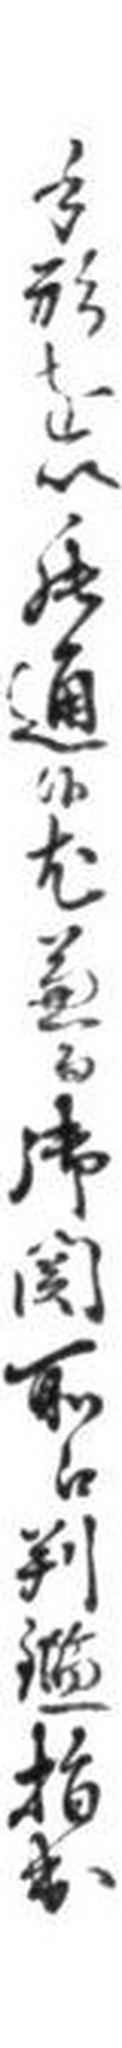手形を以罷通候尤兼而御関所江判鑑指出
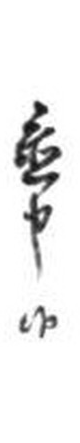置申候
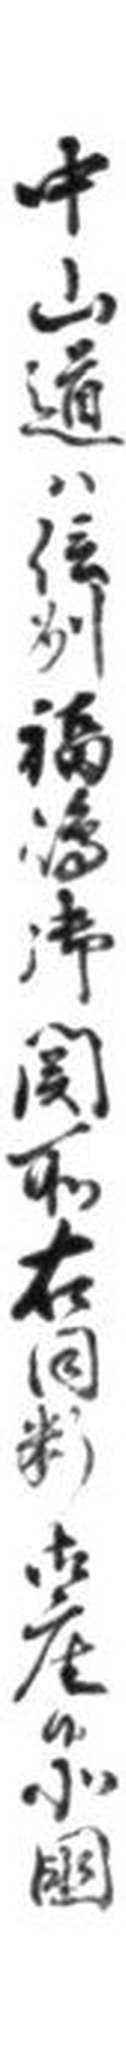中山道ハ信州福嶋御関所右同断御座候北国
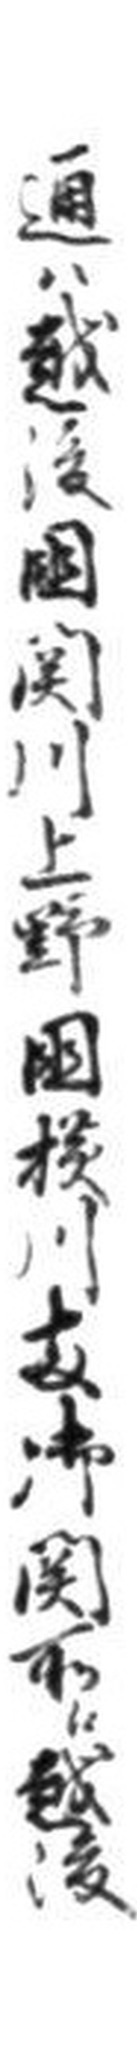通ハ越後国関川上野国横川両御関所江越後
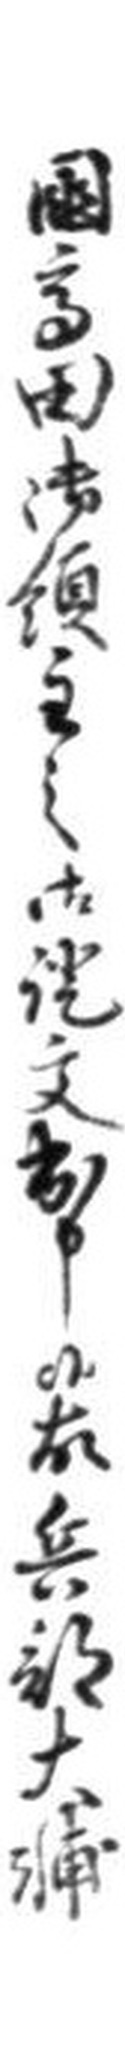国高田御領主之御証文出申候故兵部大輔
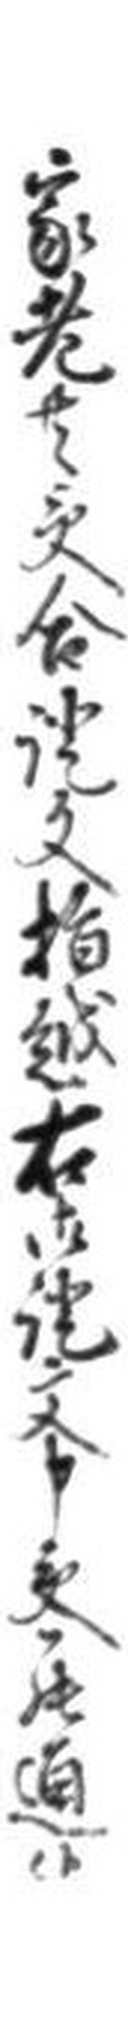家老共受合証文指越右御証文申受罷通候
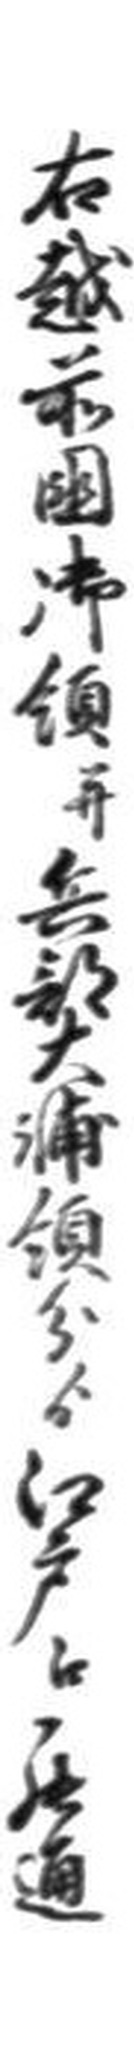右越前国御領并兵部大輔領分ゟ江戸江罷通
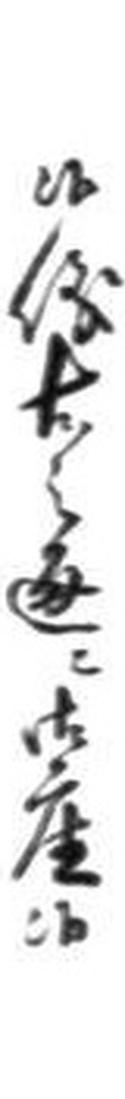候儀右之通ニ御座候
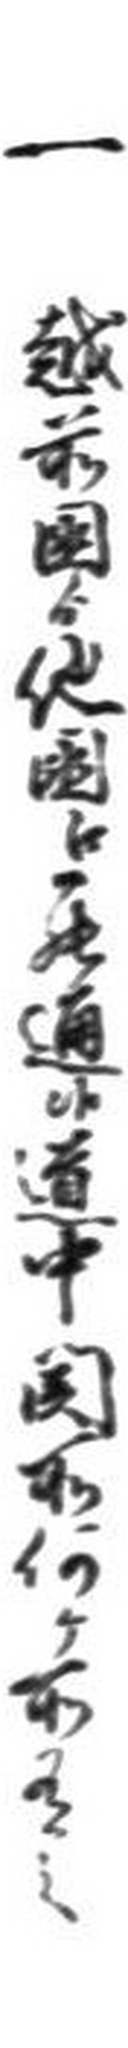一越前国ゟ他国江罷通候道中関所何ケ所有之
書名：家譜 二十二 吉品公 従元禄十五年到同十六年
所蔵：福井県文書館 Fukui Prefectural Archives
